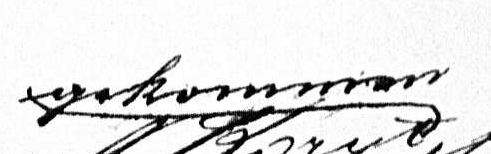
gekommen
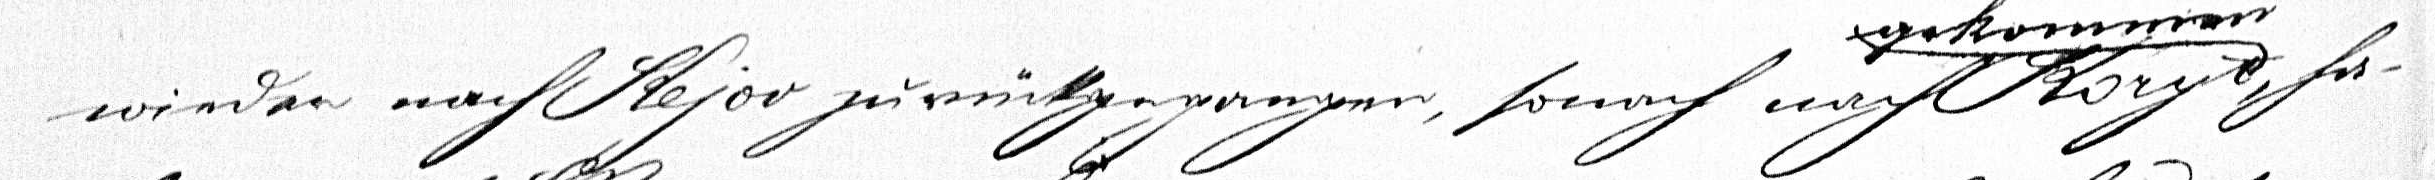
wieder nach Kejov zurückgegangen, sonach nach Koryt, ha¬
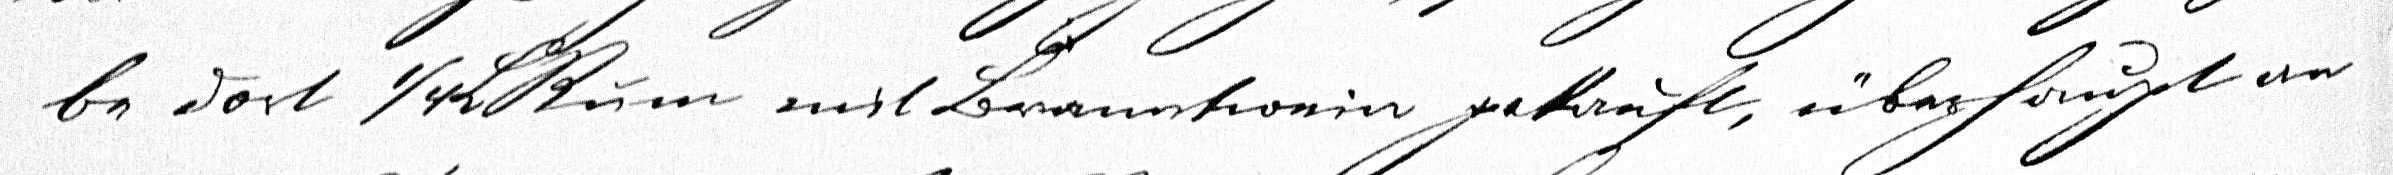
be dort ¼ L Rum mit Branntwein gekauft, überhaupt an
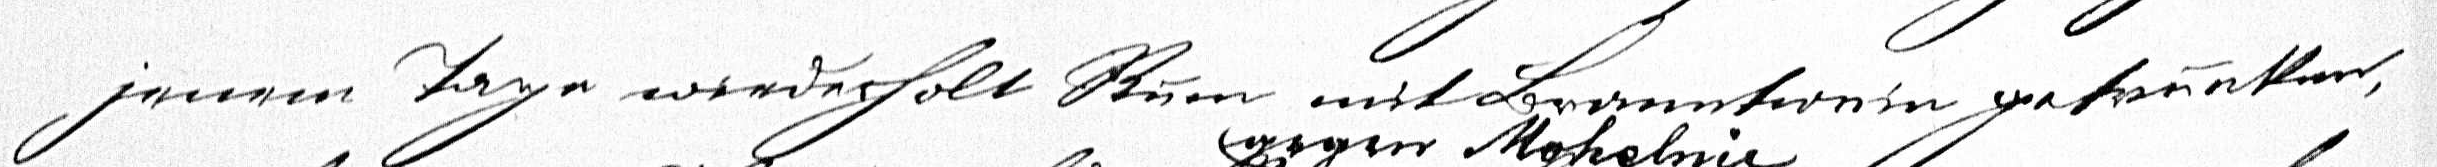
jenem Tage wiederholt Rum mit Branntwein getrunken,
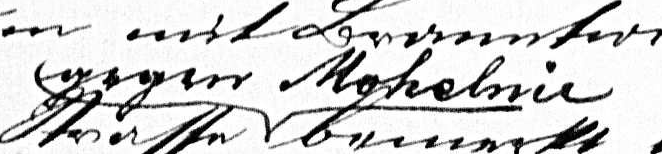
gegen Mohelnic
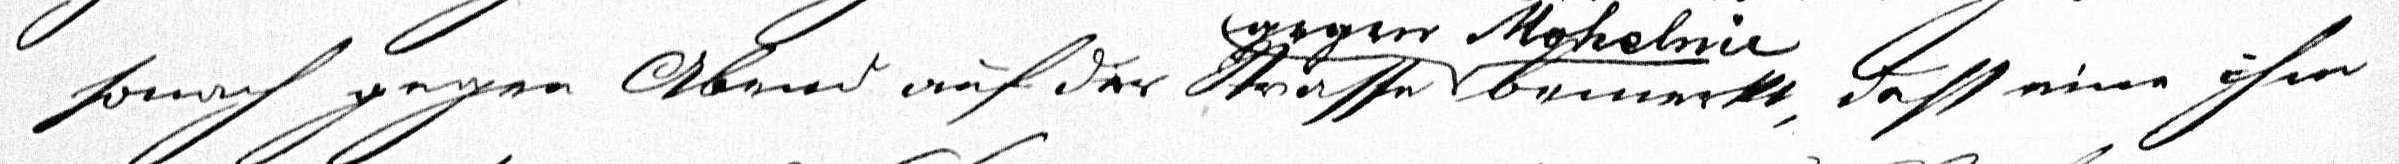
sonach gegen Abend auf der Strasse bemerkt, daß eine ihm
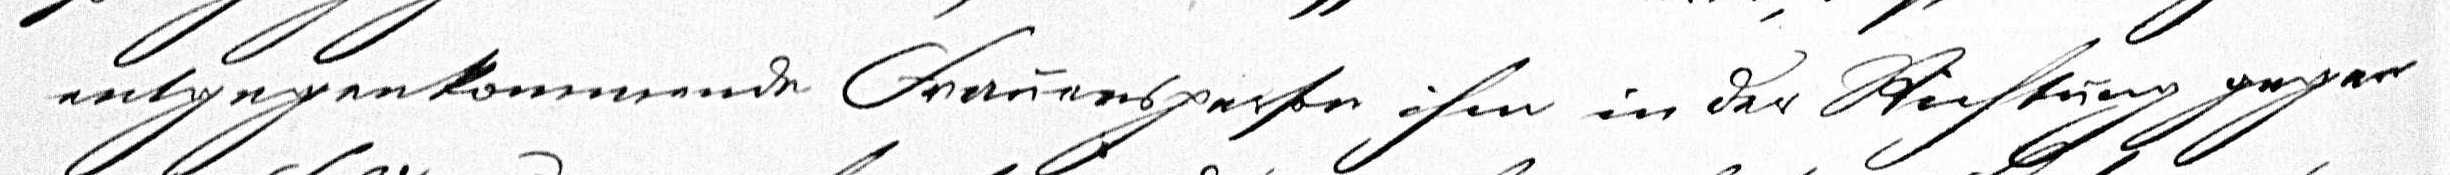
entgegenkkommende Frauensperson ihm in der Richtung gegen
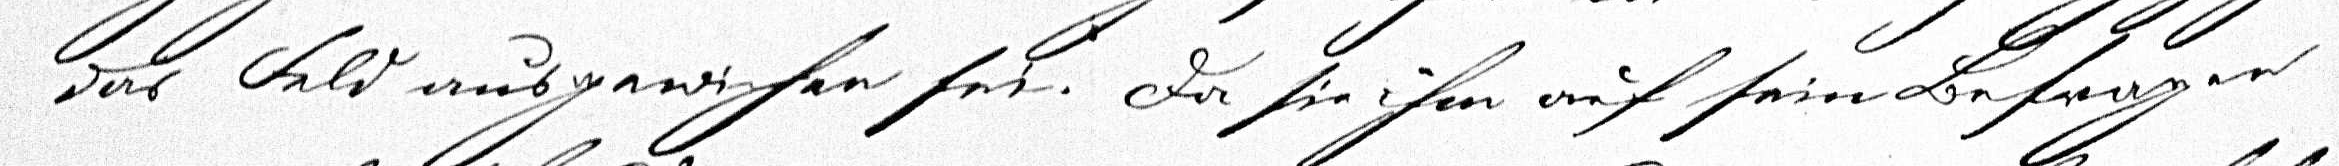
das Geld ausgewichen sei. Da sie ihm auf sein Befragen
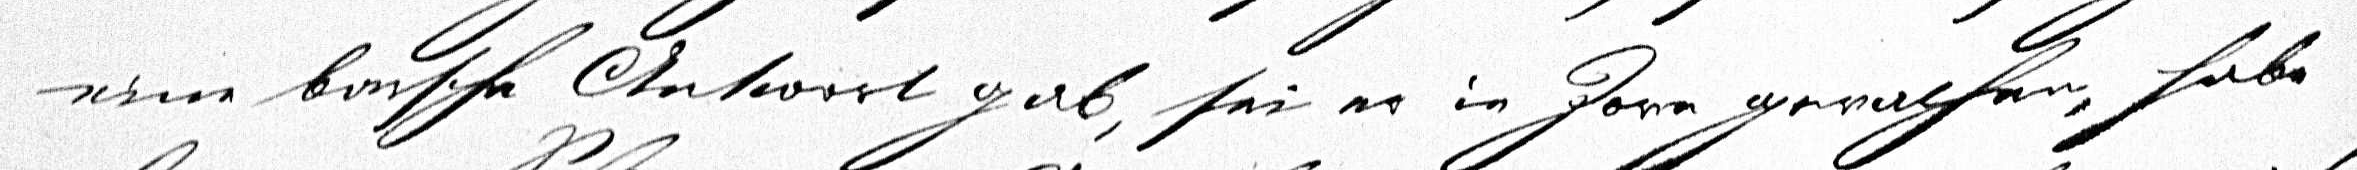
eine barsche Antwort gab, sei er in Zorn gerathen, habe
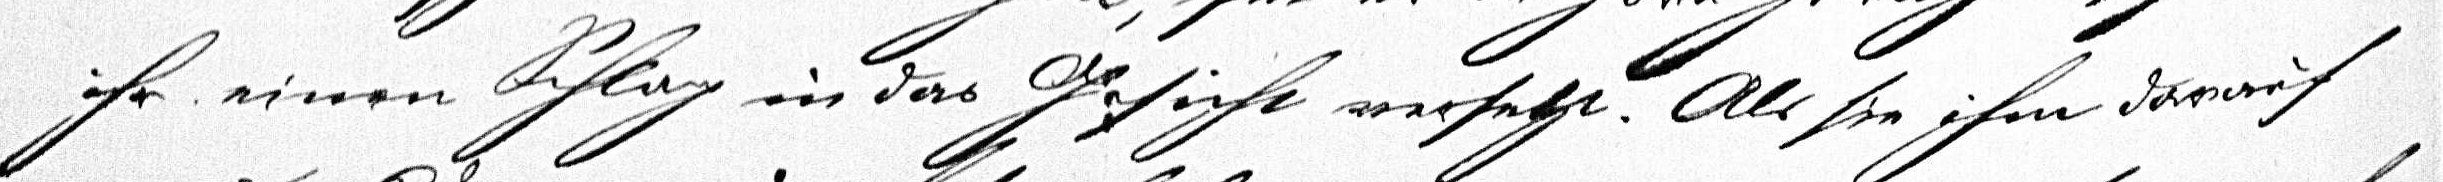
ihr einen Schlag in das Gesicht versetzt. Als sie ihm darauf
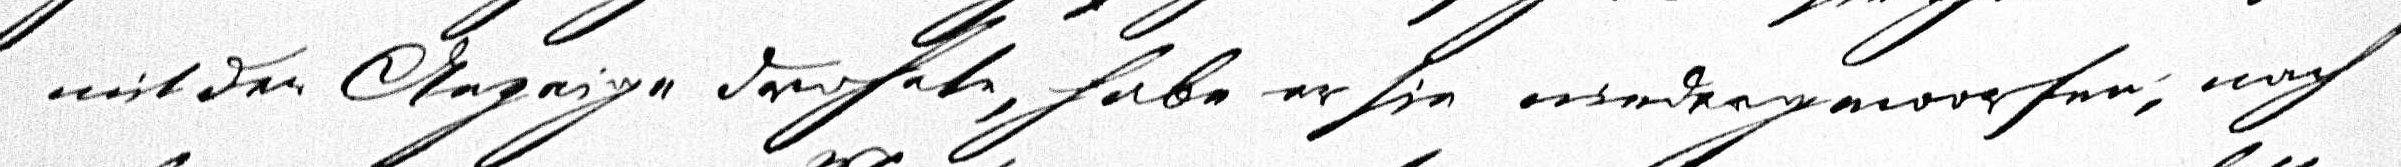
mit der Anzeige drohte, habe er sie wiedergeworfen, nach
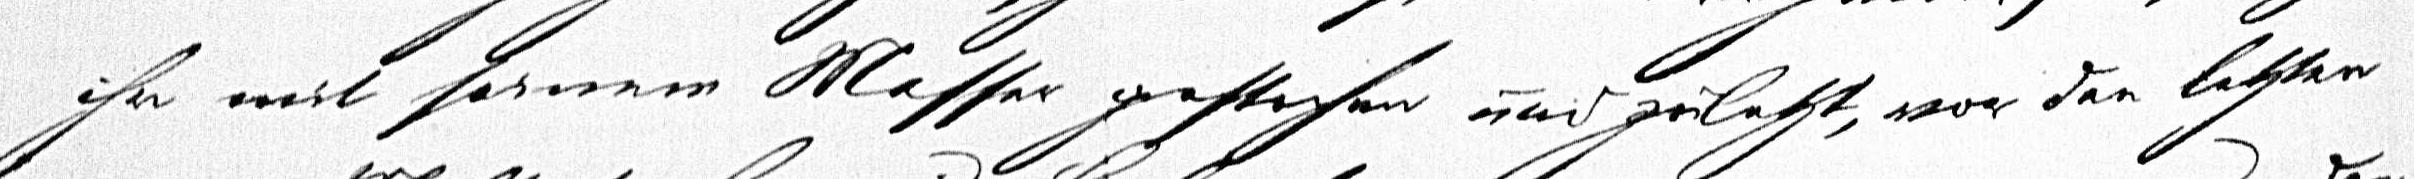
ihr mit seinem Messer gestochen und zuletzt, vor den letzten
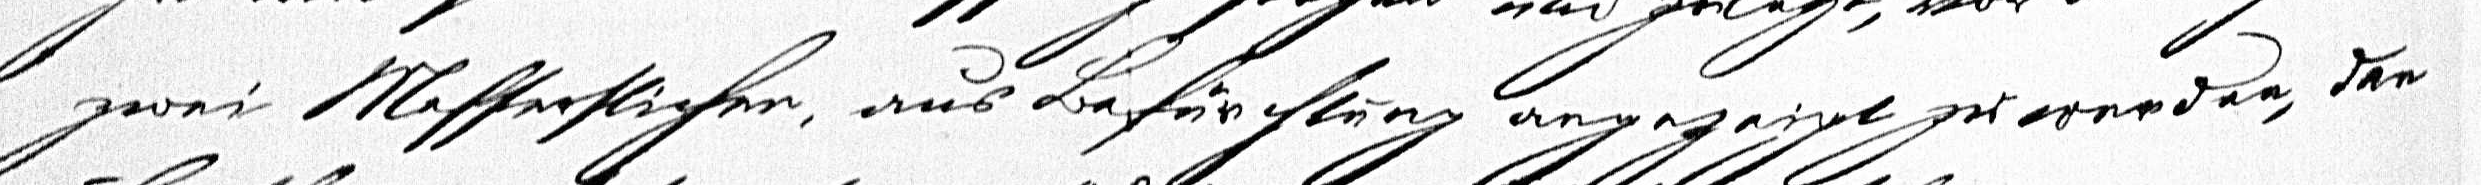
zwei Messerstichen, aus Befürchtung angezeigt zu werden, den
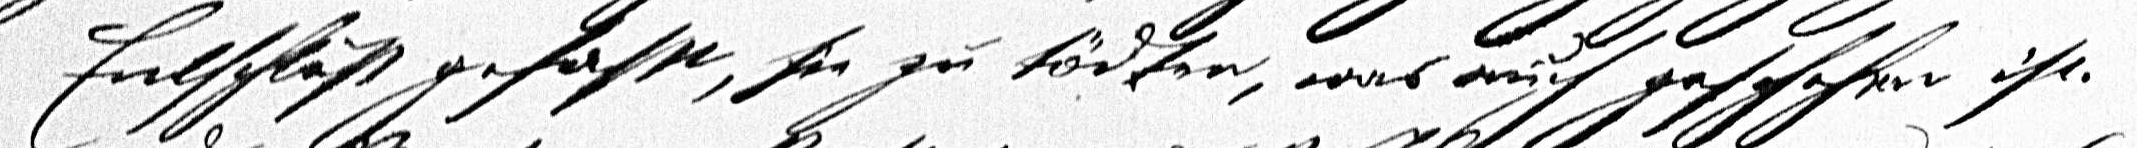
Entschluß gefaßt, sie zu tödten, was auch geschehen ist.
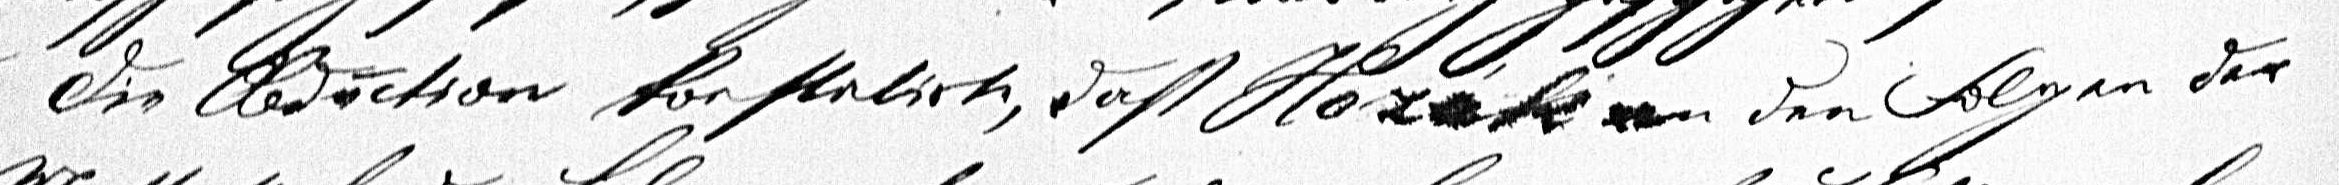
Die Obduction konstatirte, daß Hozák an den Folgen der
